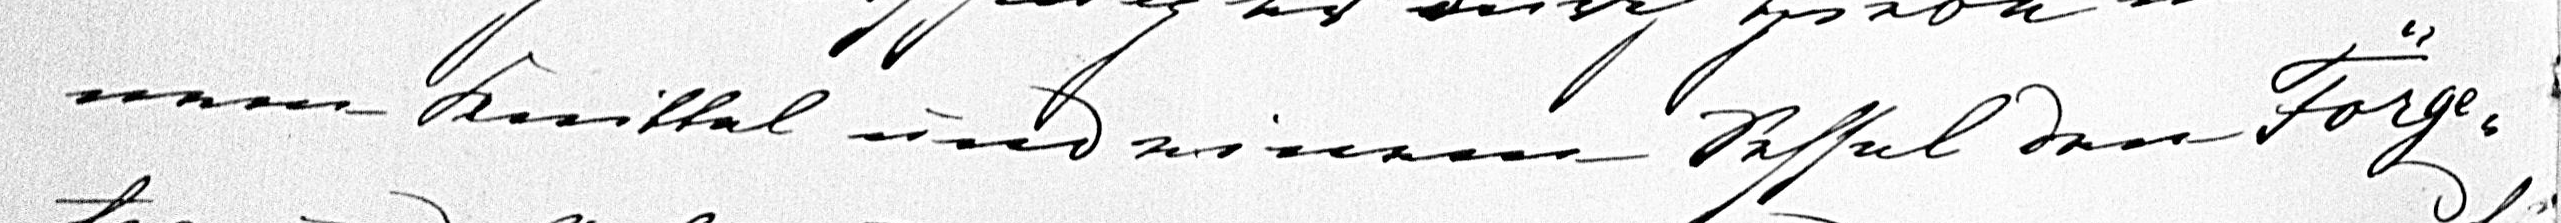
nem Knittel und einem Sessel den Förge¬
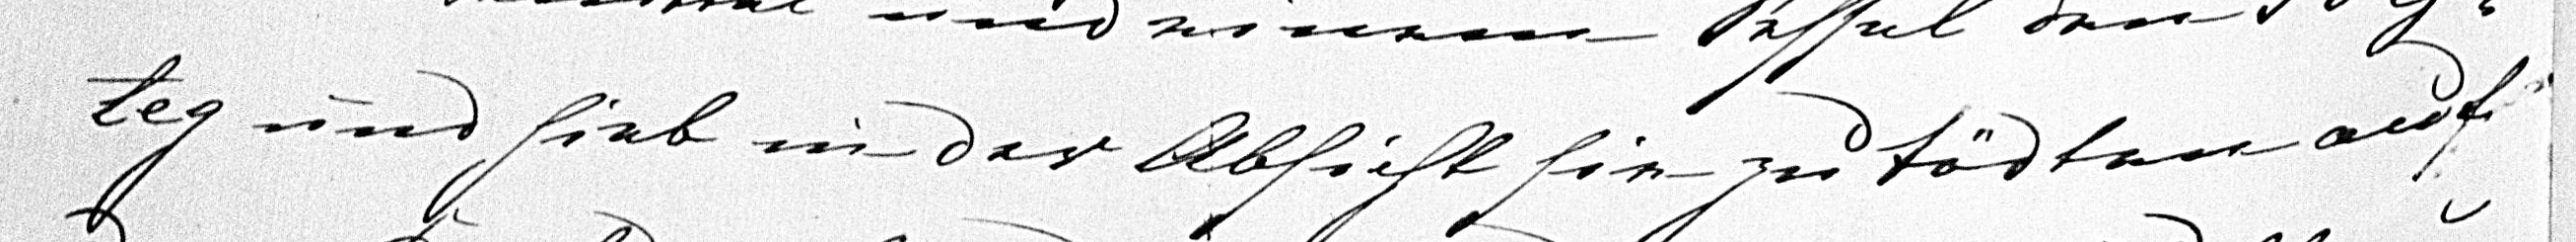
teg und hieb in der Absicht sie zu tödten auf
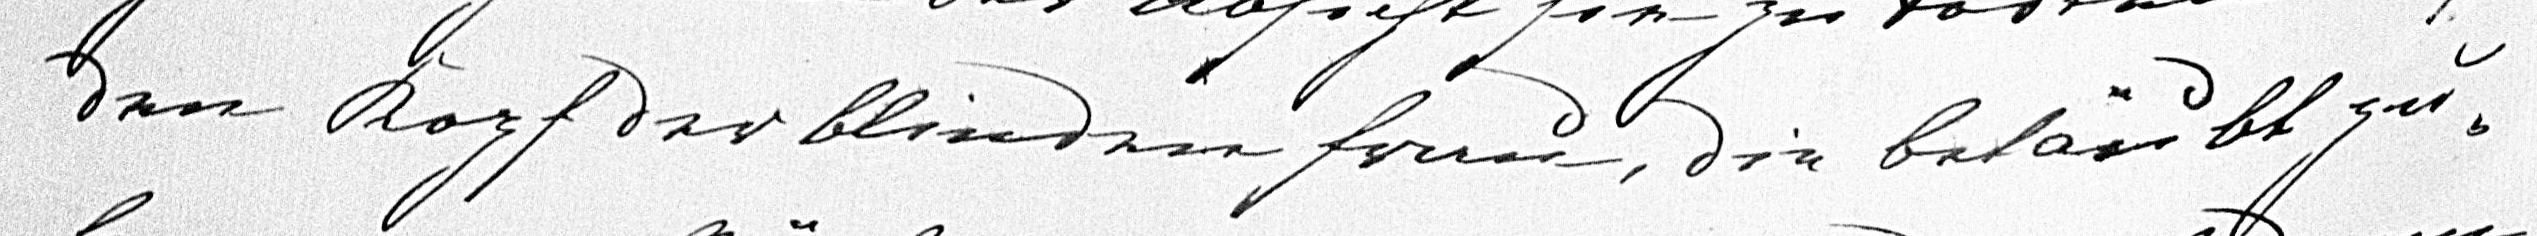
den Kopf der blinden frau, die betäubt zu¬
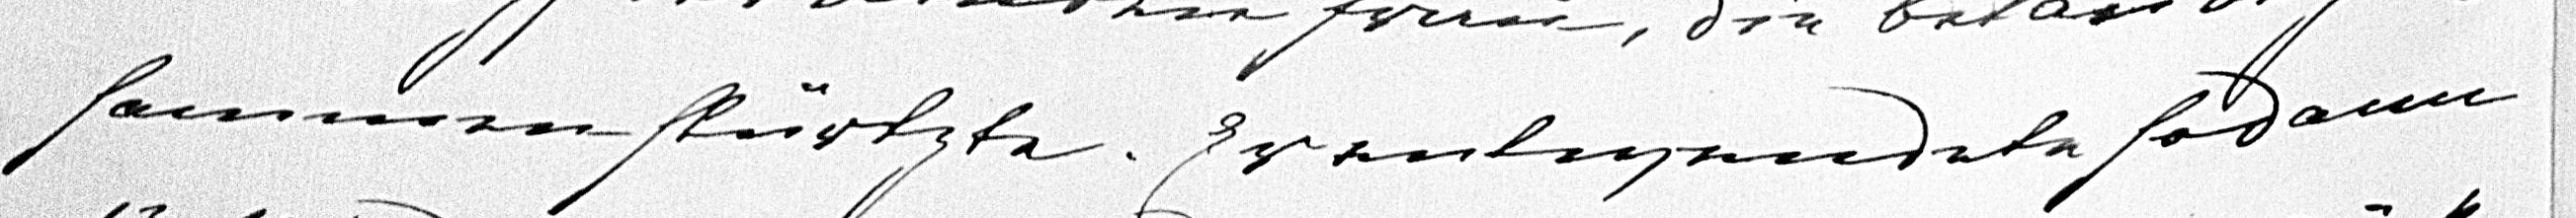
sammen stürtzte. Er entwendete sodann
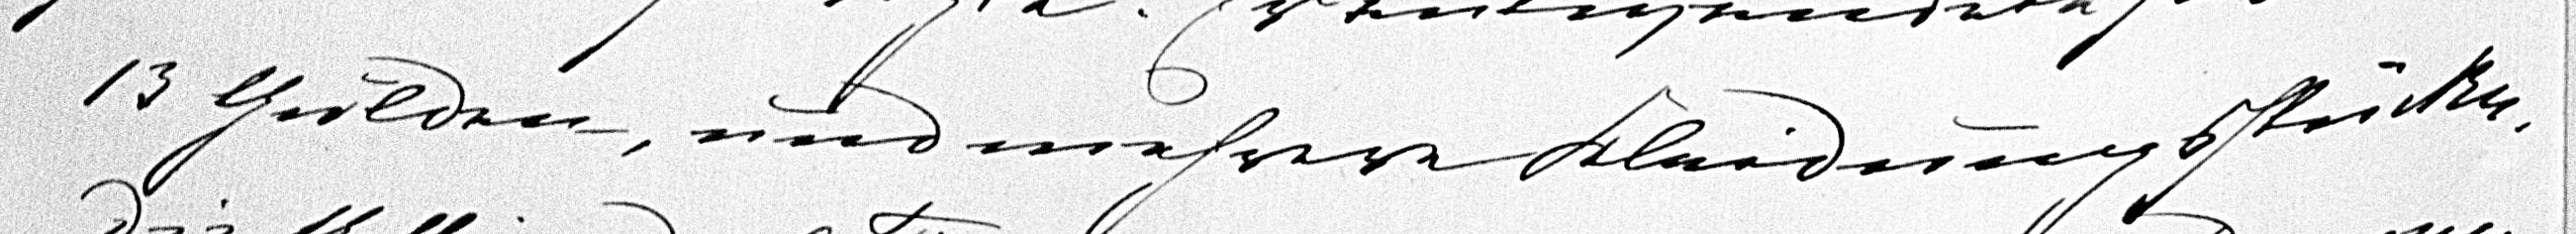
13 Gulden, und mehrere Kleidungsstücke
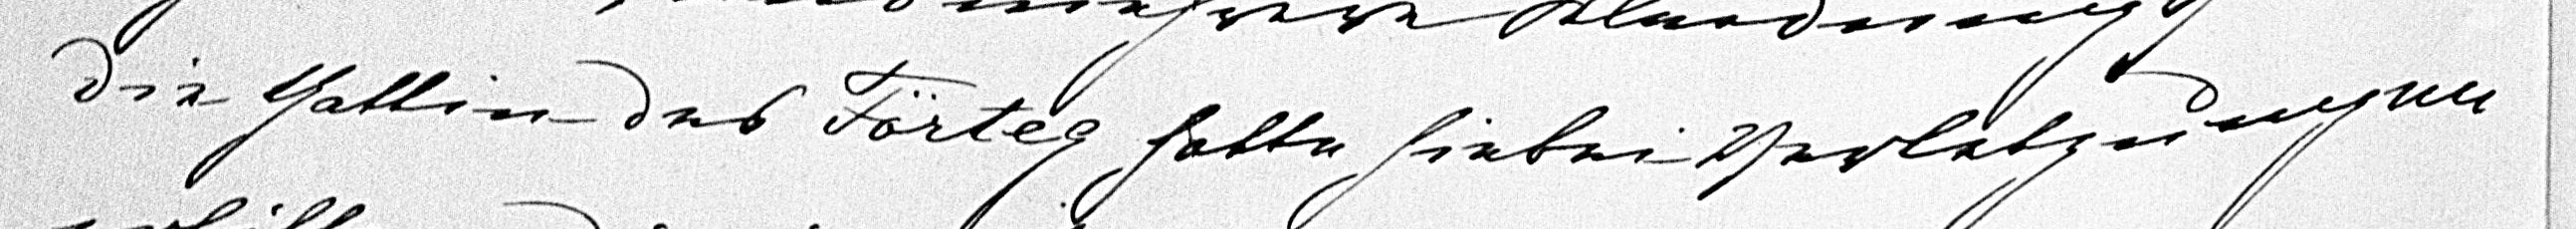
die Gattin des Förteg halte hiebei Verletzungen
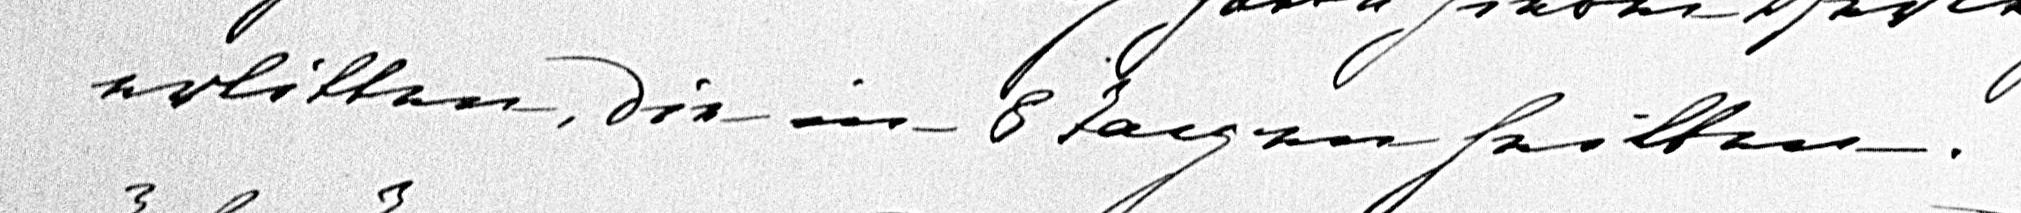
erlitten, die in 8 Tagen heilten.
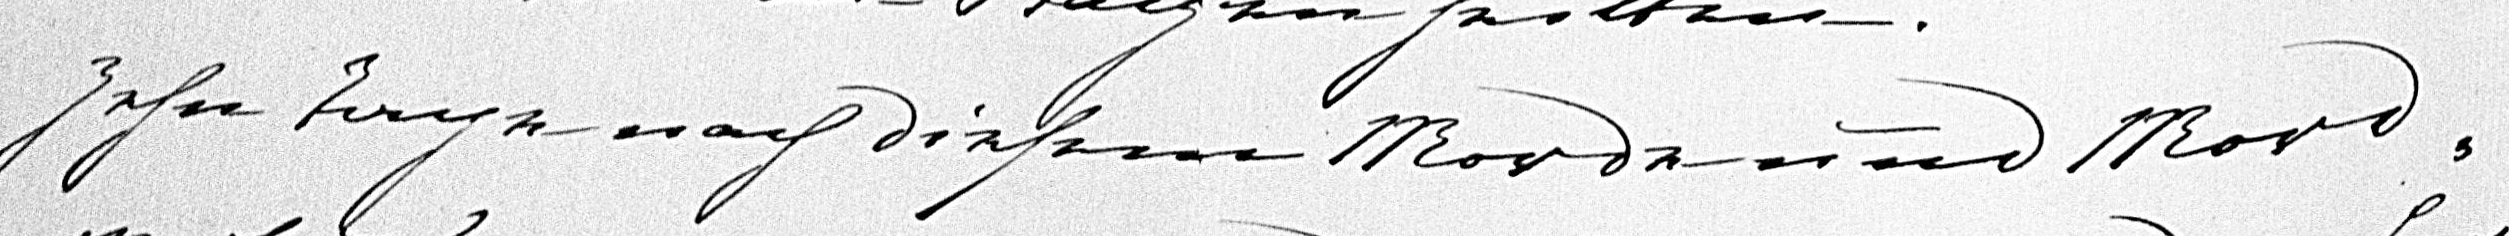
Zehn Tage nach diesem Morde und Mord
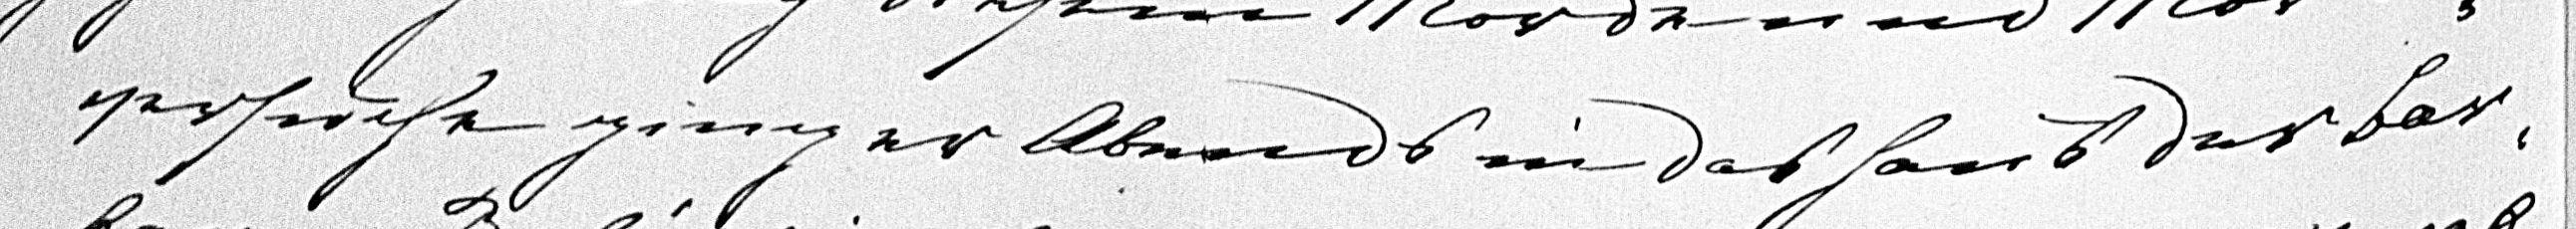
versuche ging er Abends in das Haus der Bar¬
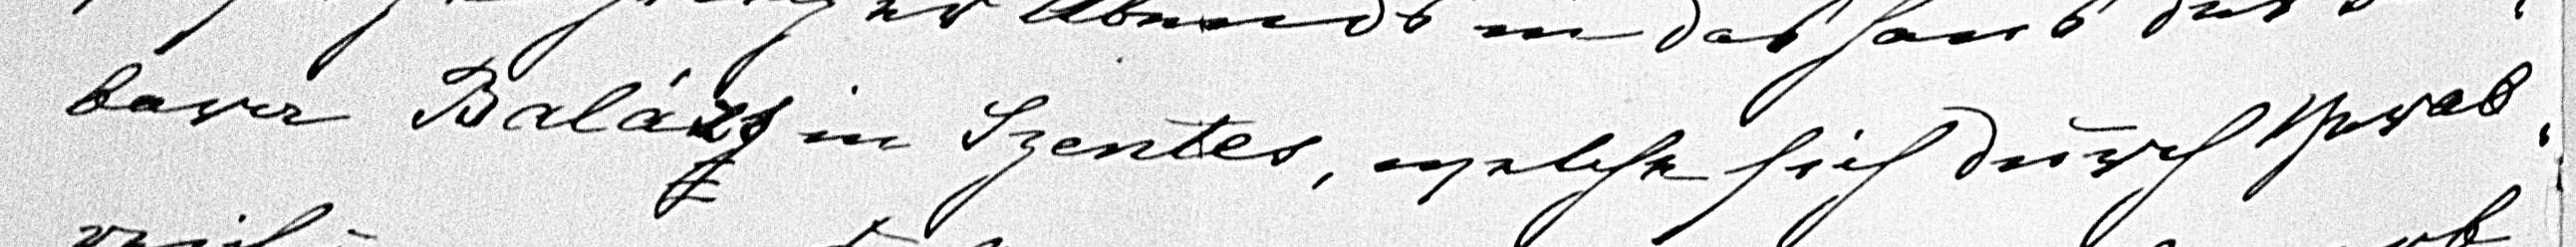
bara Balázs in Szentes, welche sich durch Verab¬
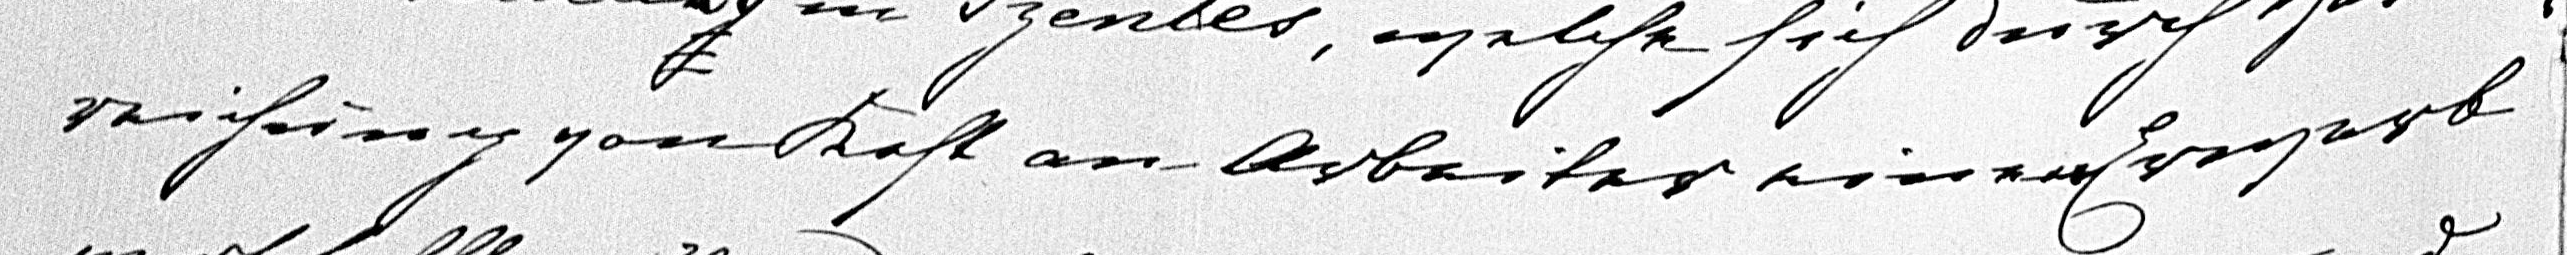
reichung von Kost an Arbeiter ein er Erwerb
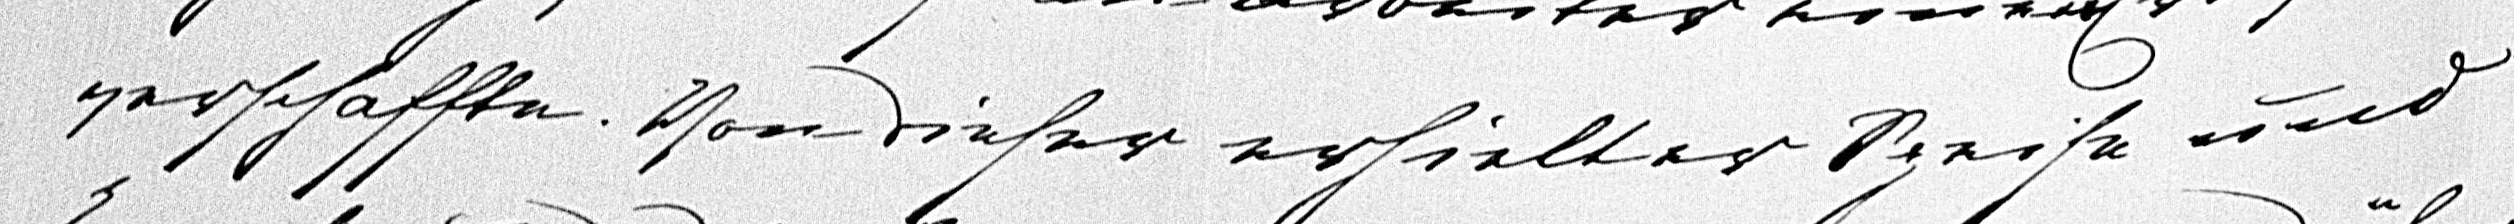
verschaffte. Von dieser erhielt er Speise und
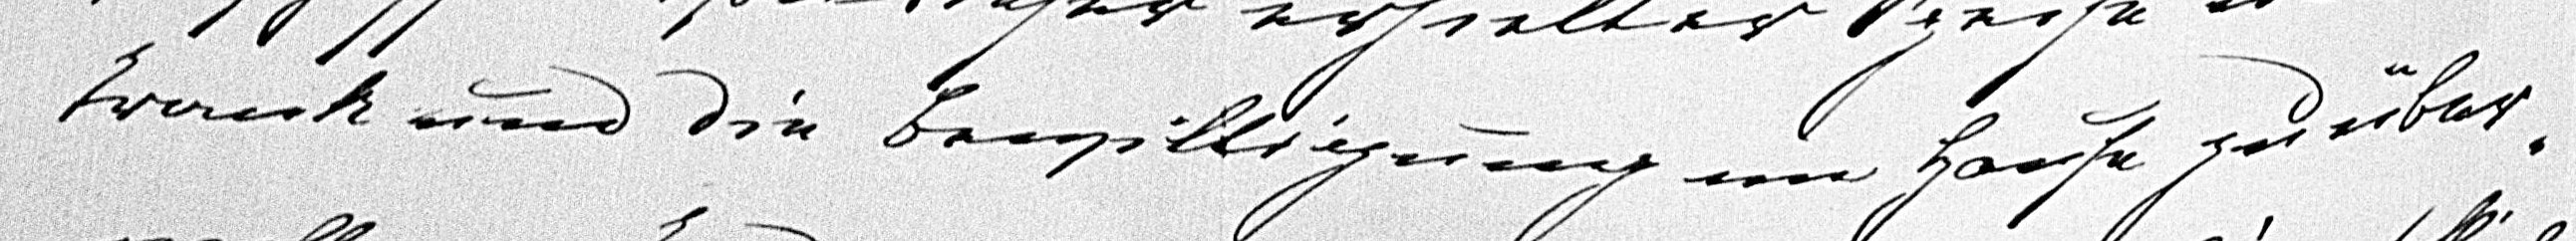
Trank und die Bewilligung im Hause zu über¬
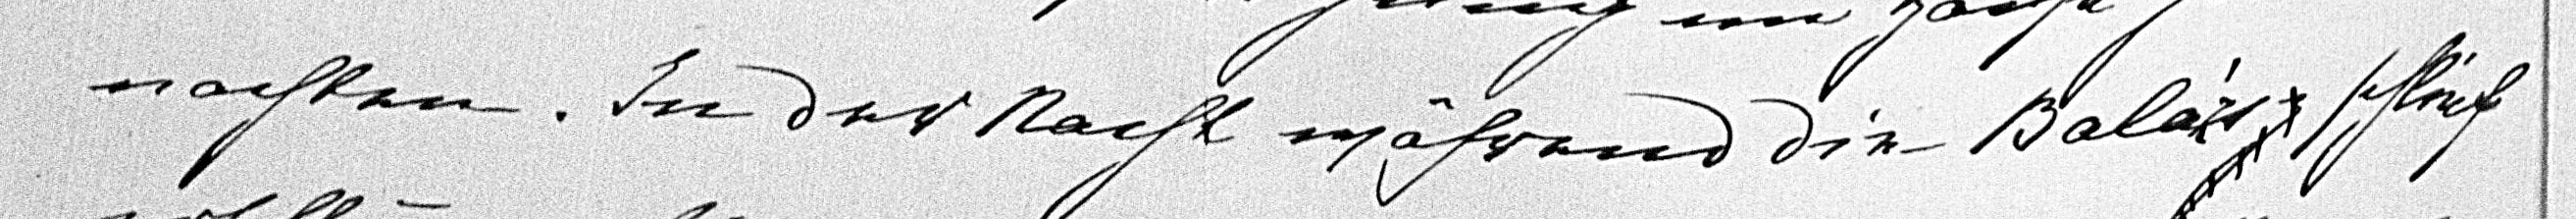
nachten. In der Nacht während die Balázs schlief
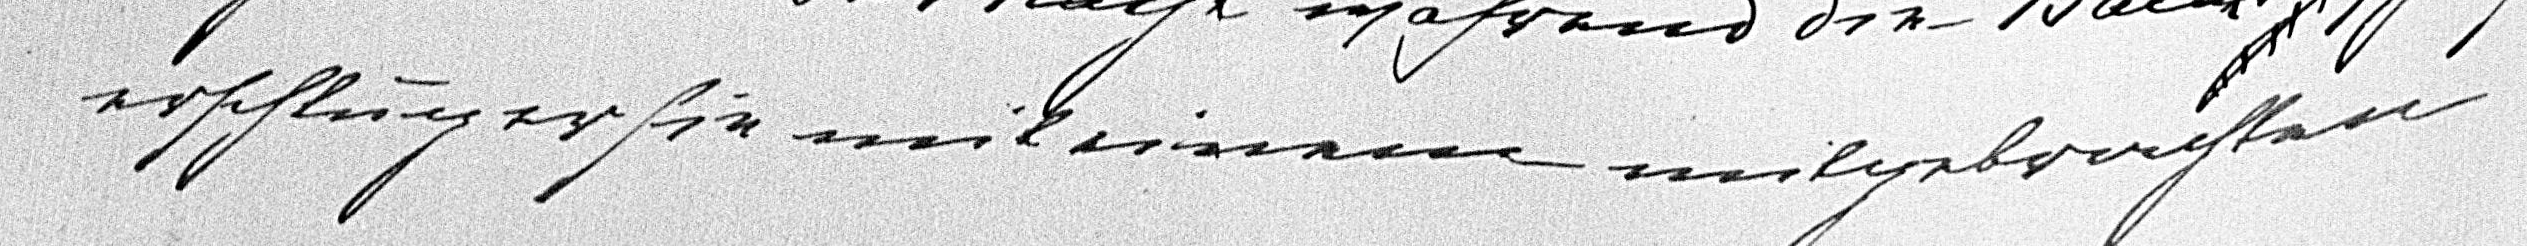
erschlug er sie mit einem mitgebrachten
